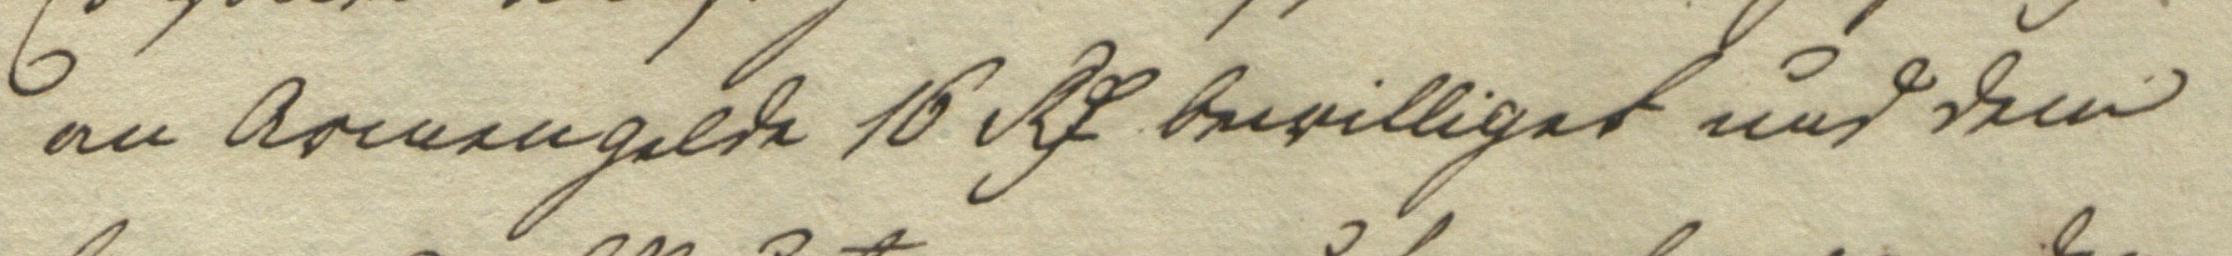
an Armengelde 16 Rf bewilliget und dem
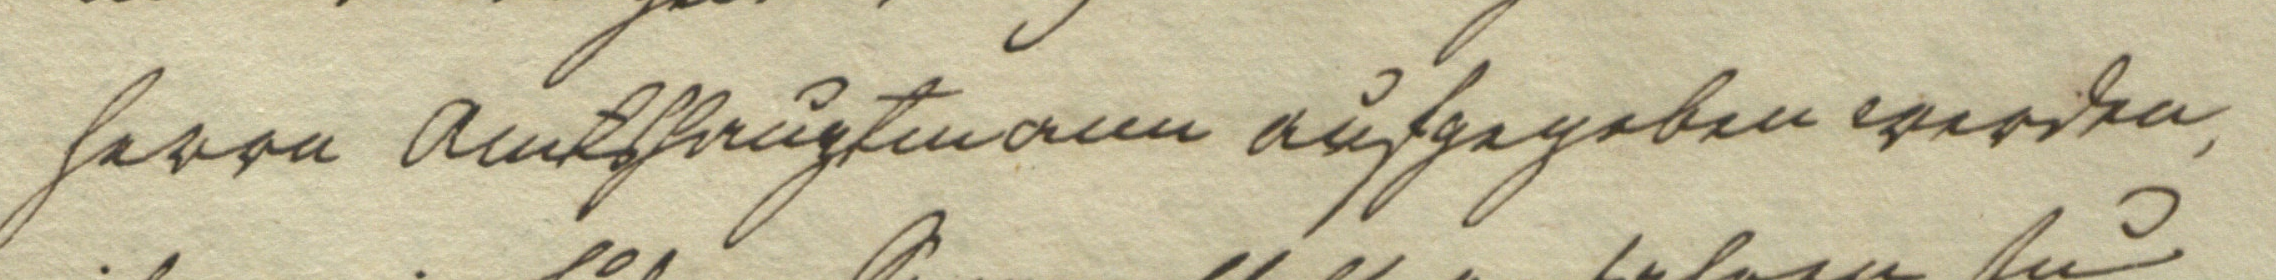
Herrn Amtshauptmann aufgegeben werden,
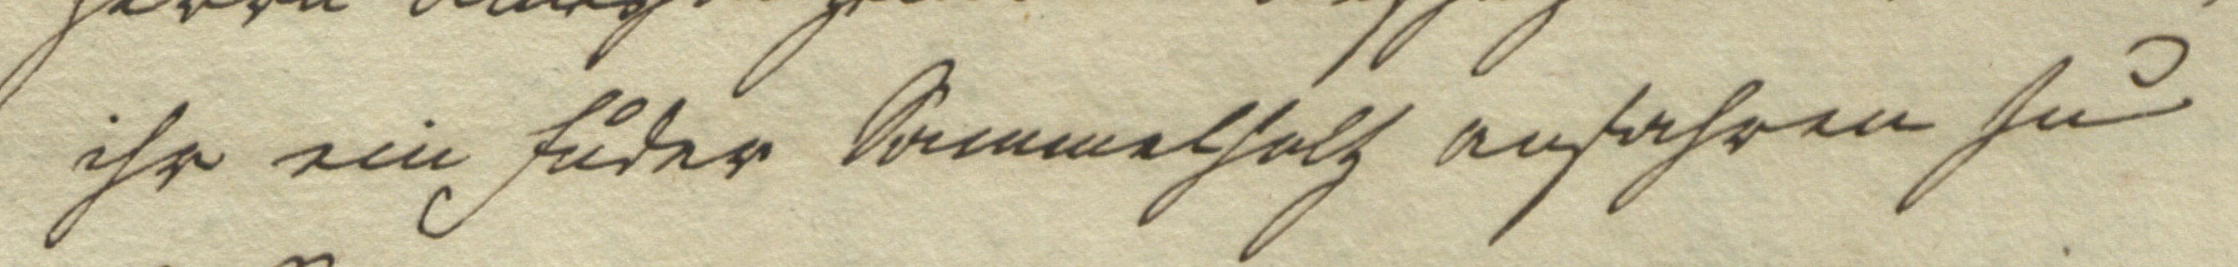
ihr ein Fuder Sammelhalz anfahren zu
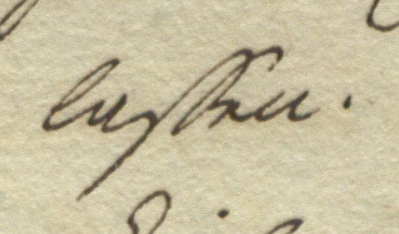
lassen.
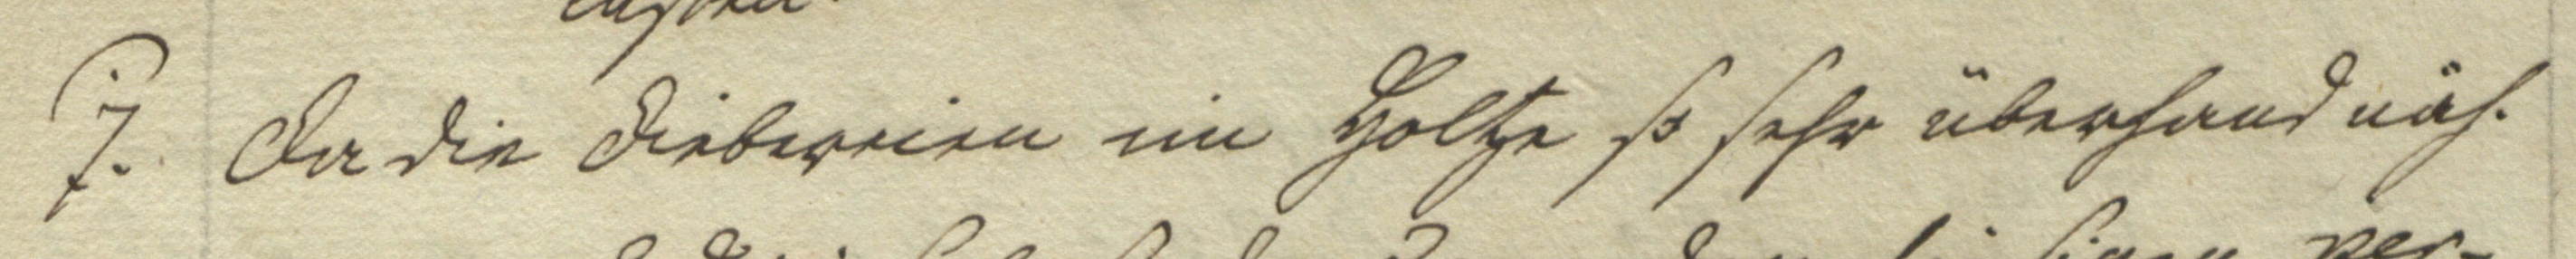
7. Da die Diebereien im Holtze so sehr überhand näh¬
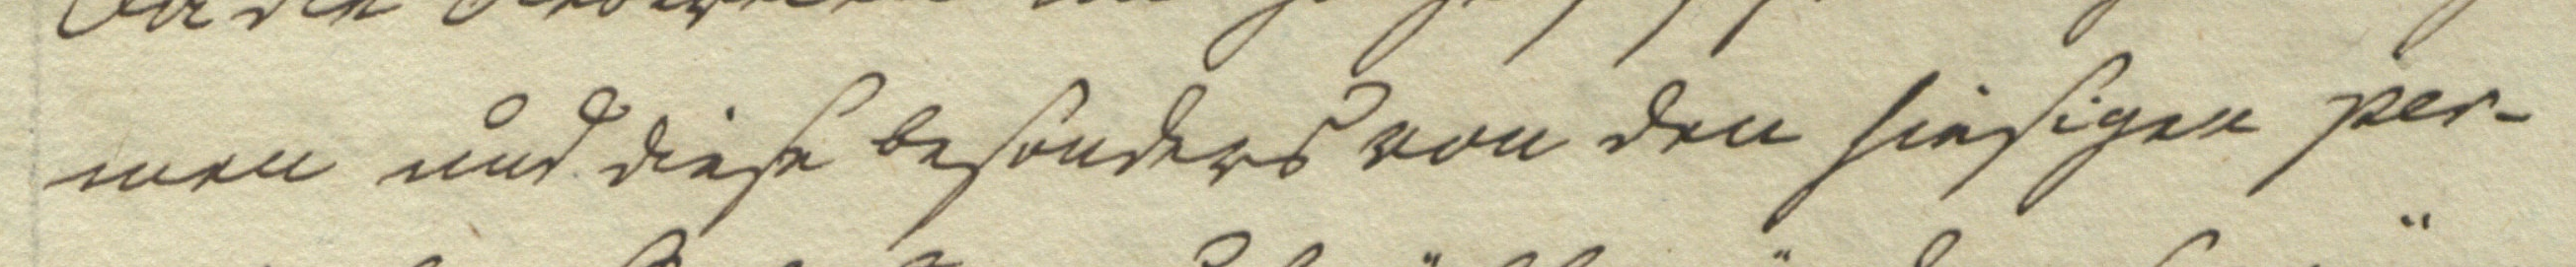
men und diese besonders von den hiesigen per¬
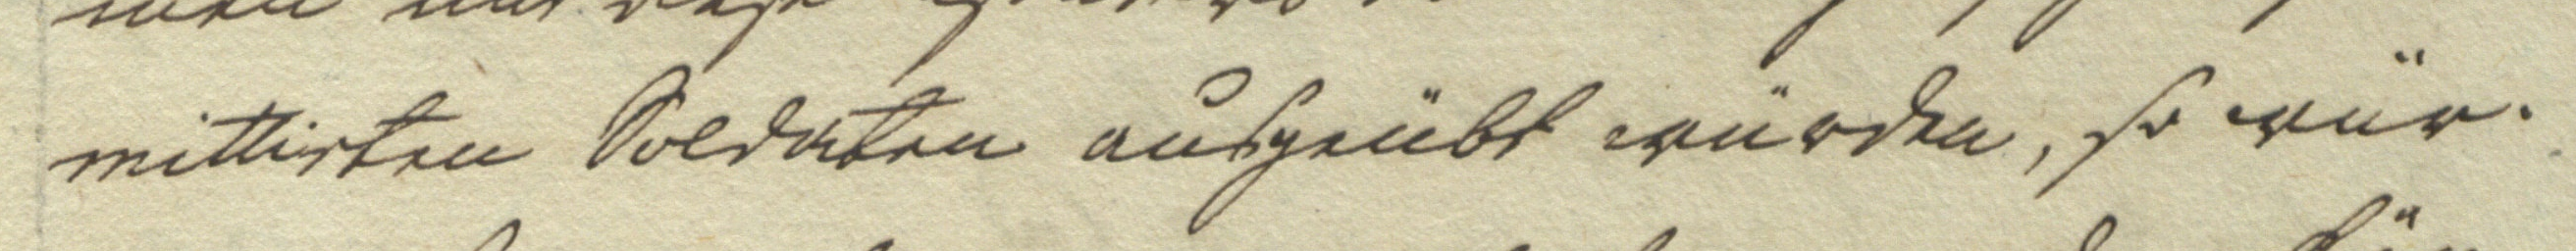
mittirten Soldaten ausgeübt würden, so wür¬
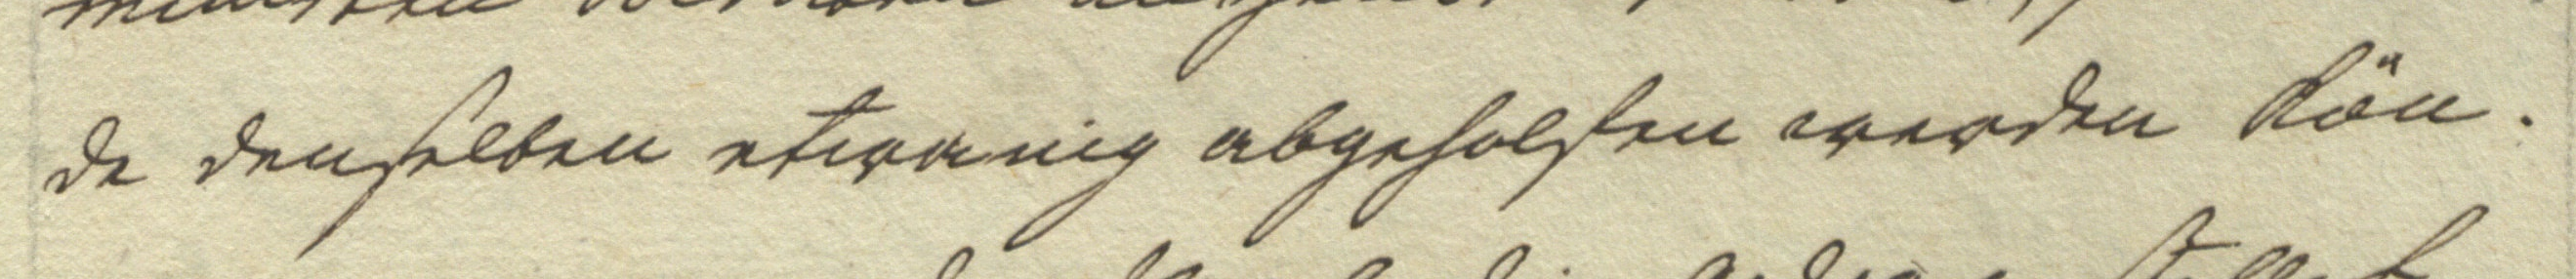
de denselben etwanig abgeholfen werden kön¬
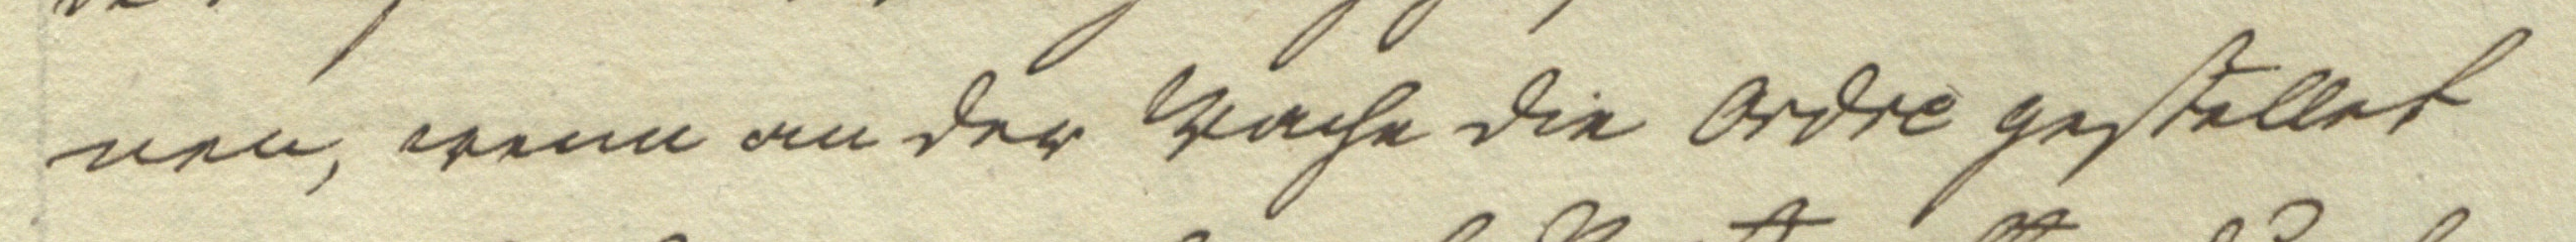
nen, wenn an der Wache die Ordre gestellet
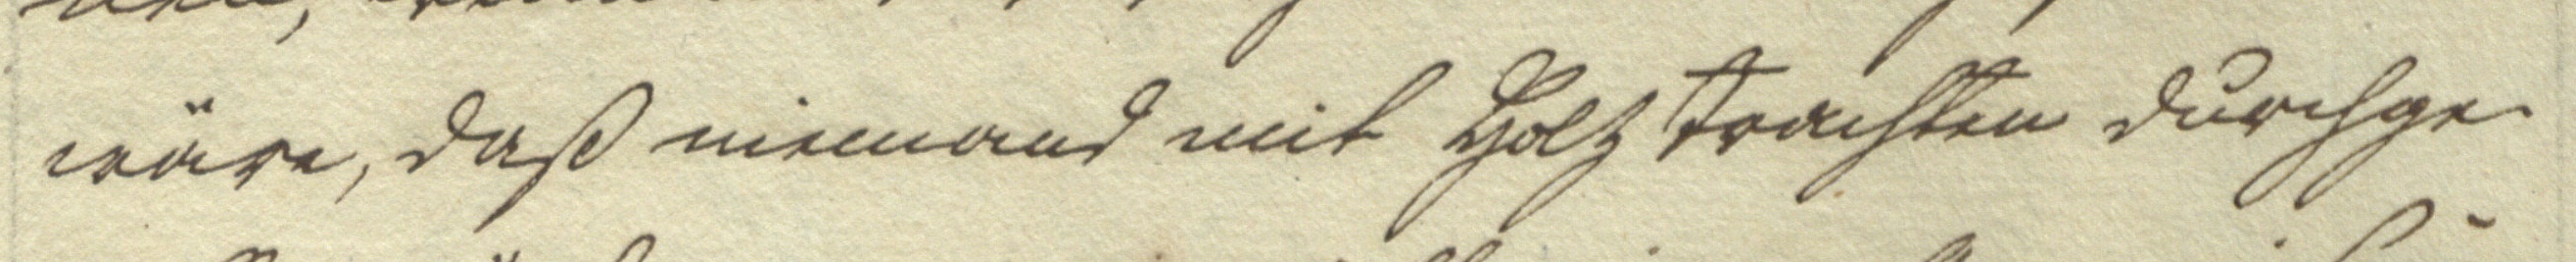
wäre, daß niemand mit Holz trachten durchge¬
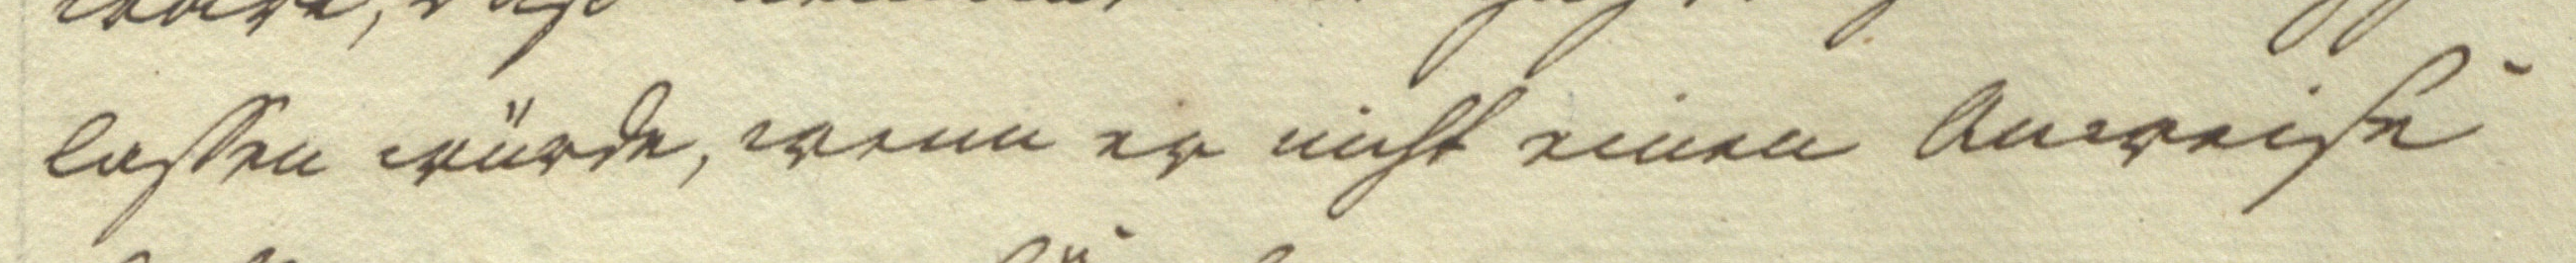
lassen würde, wenn er nicht einen Anweis¬e
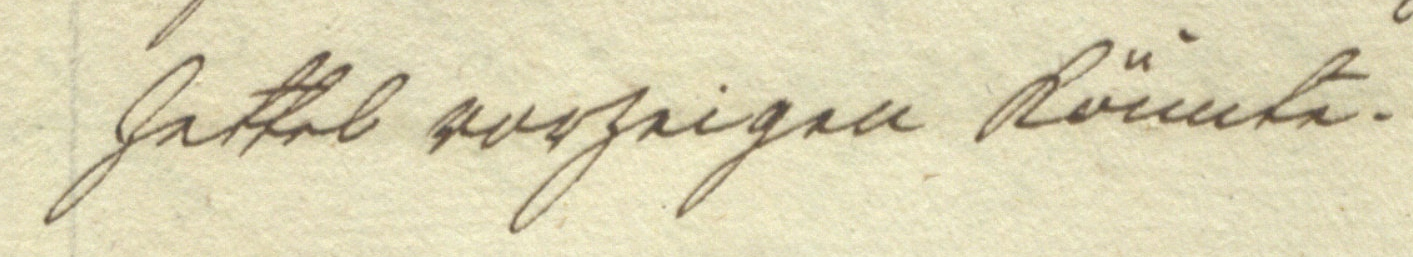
Zettel vorzeigen könnte.
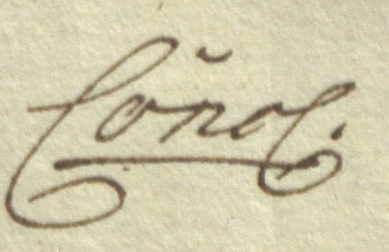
Con.
